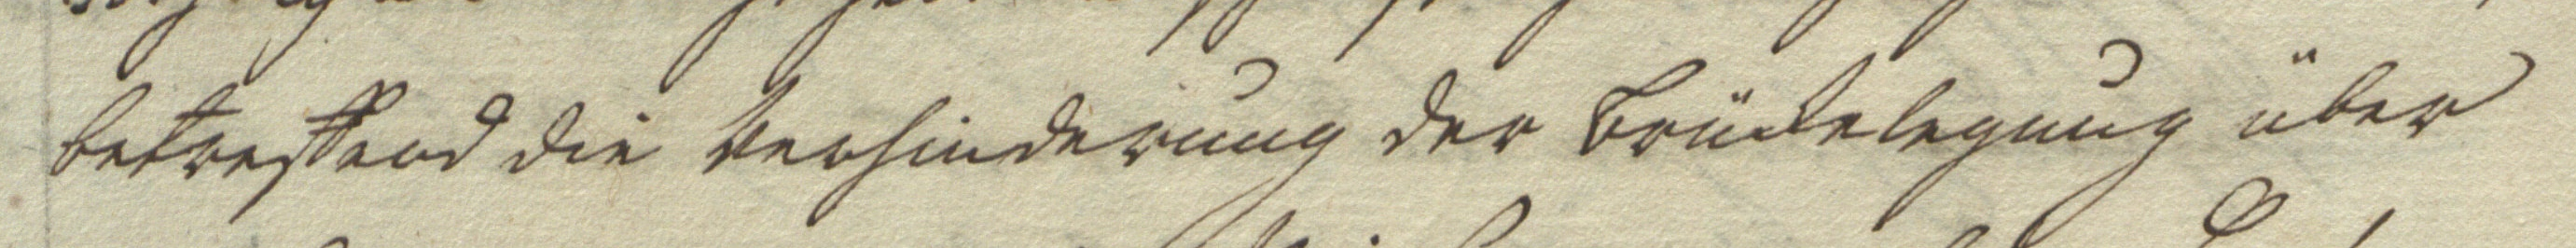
betreffend die Verhinderung der Brückelegung über
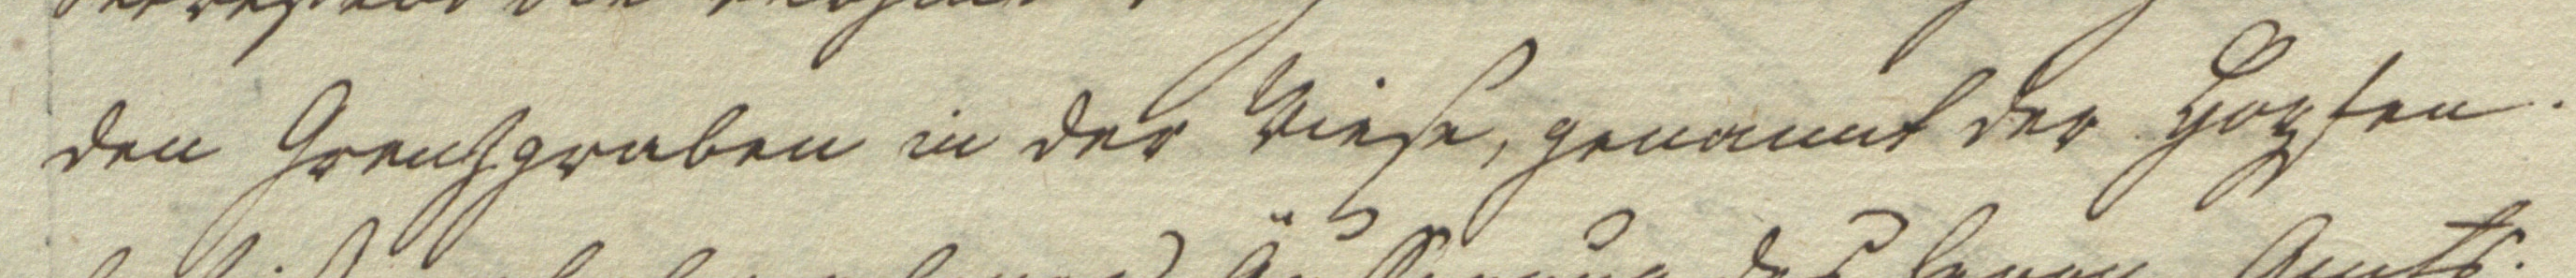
den Grenzgraben in der Wiese, genannt der Hopfen¬
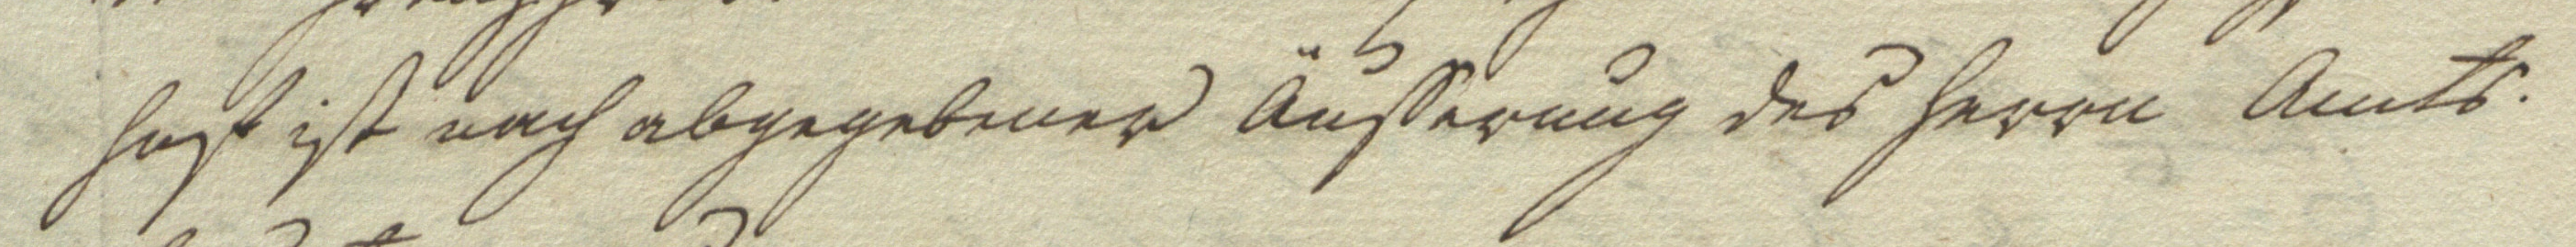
hof ist nach abgegebener Äusserung des Herrn Amts¬
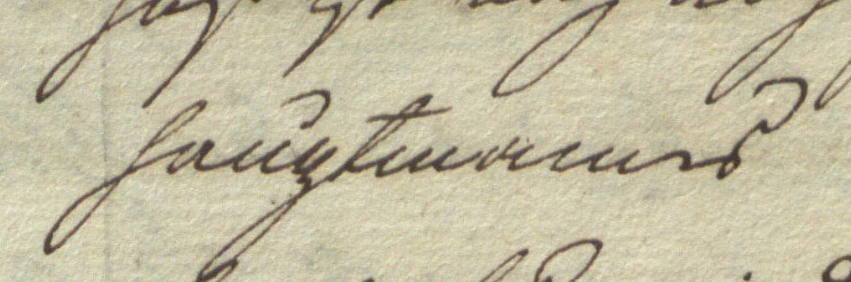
hauptmanns
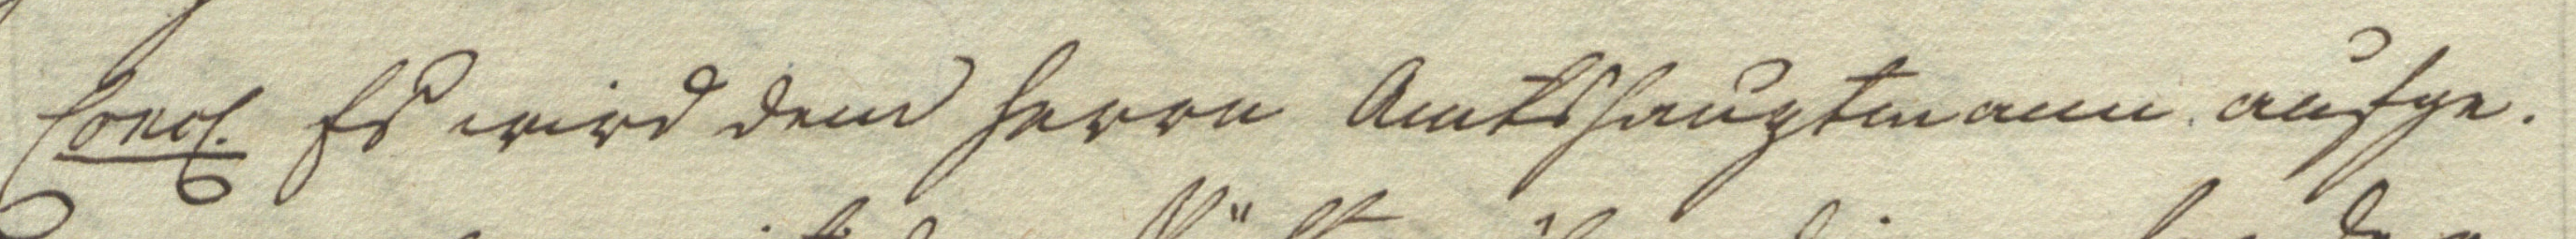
Concl. Es wird dem Herrn Amtshauptmann aufge¬
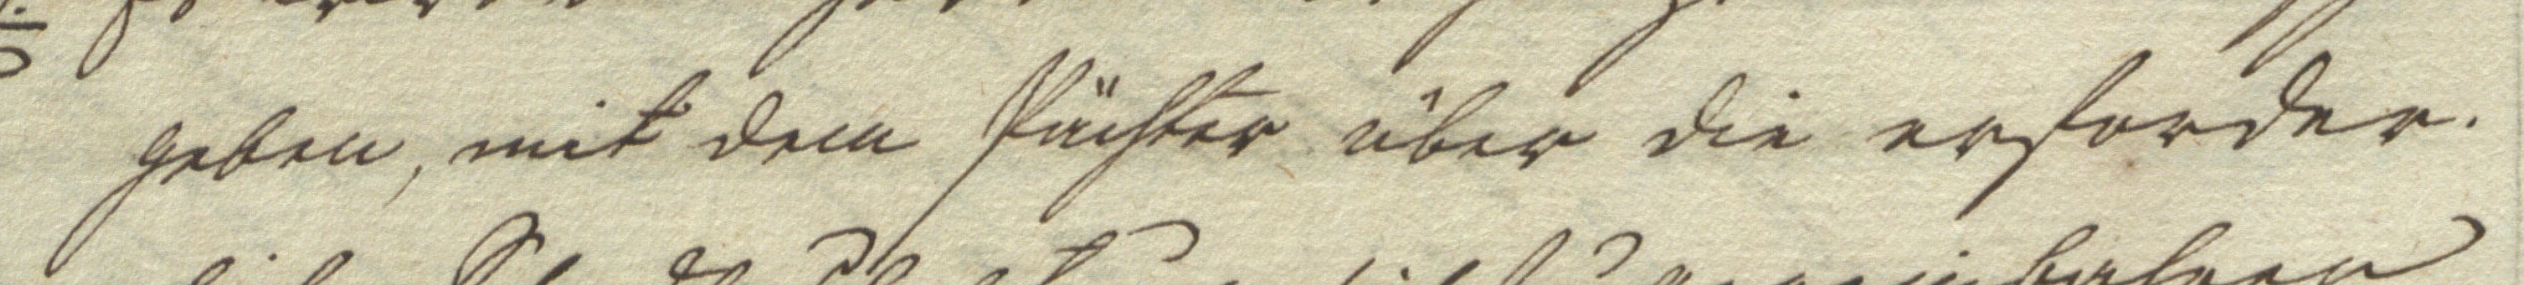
geben, mit dem Pächter über die erforder¬
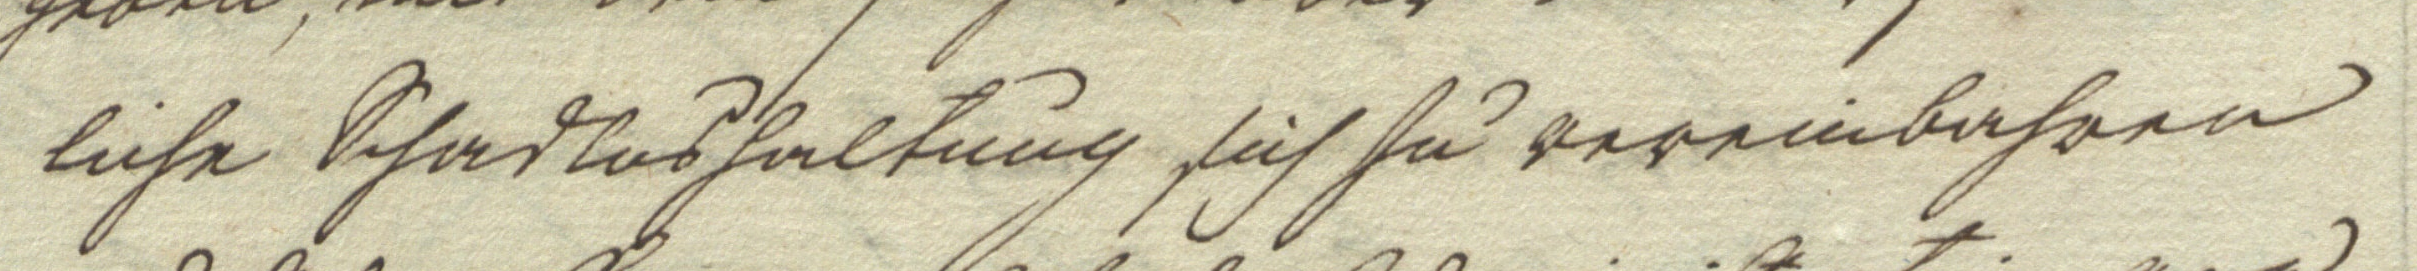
liche Schadloshaltung sich zu vereinbahren
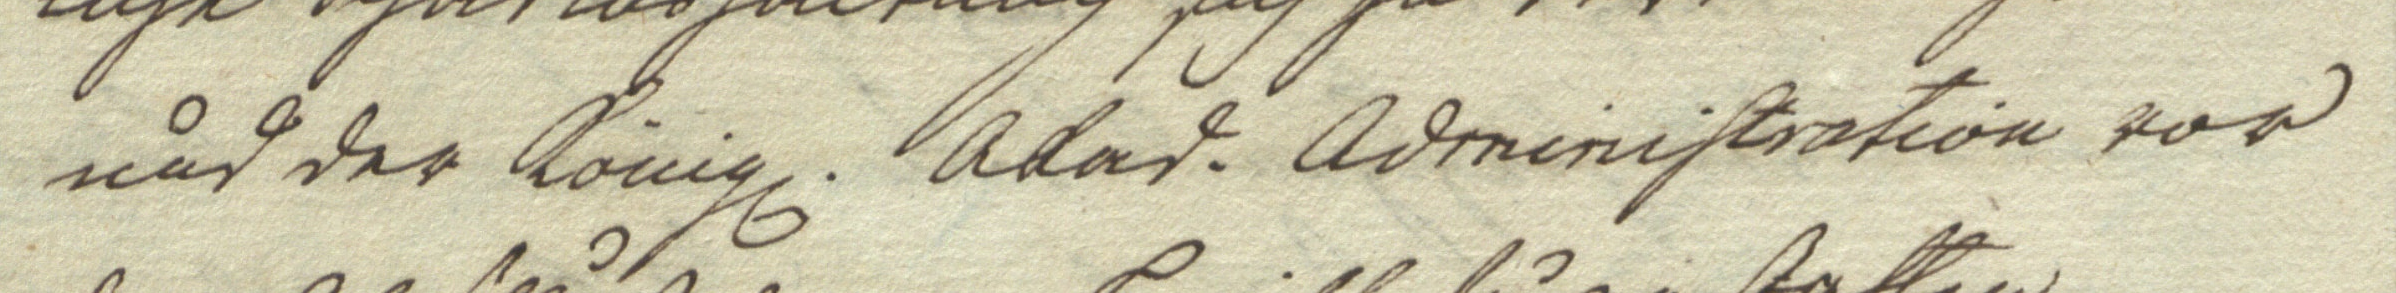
und der Königl. Akad. Administration vor
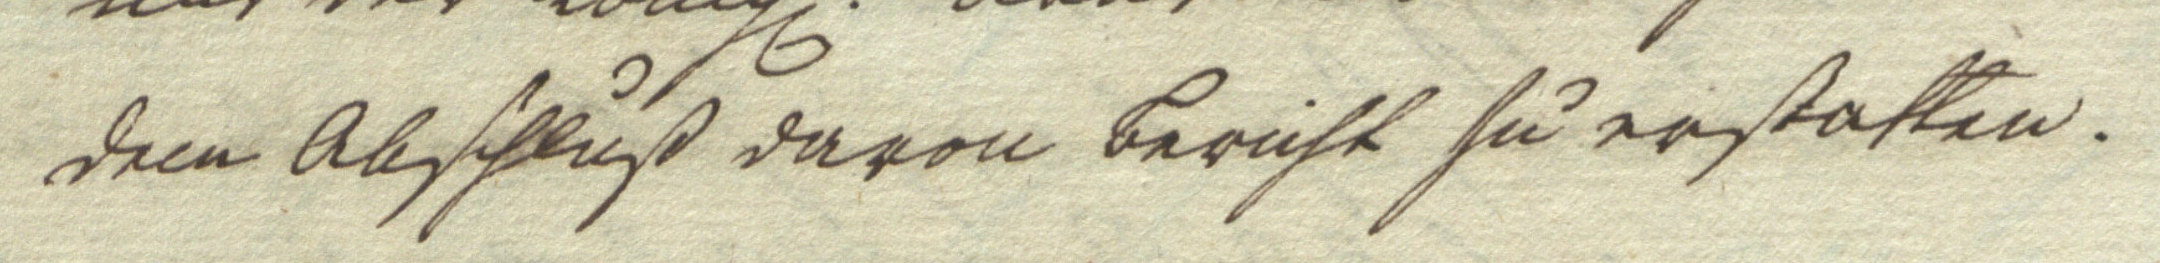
dem Abschluß davon Bericht zu erstatten.
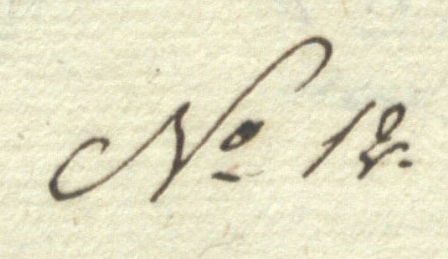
No 12.
